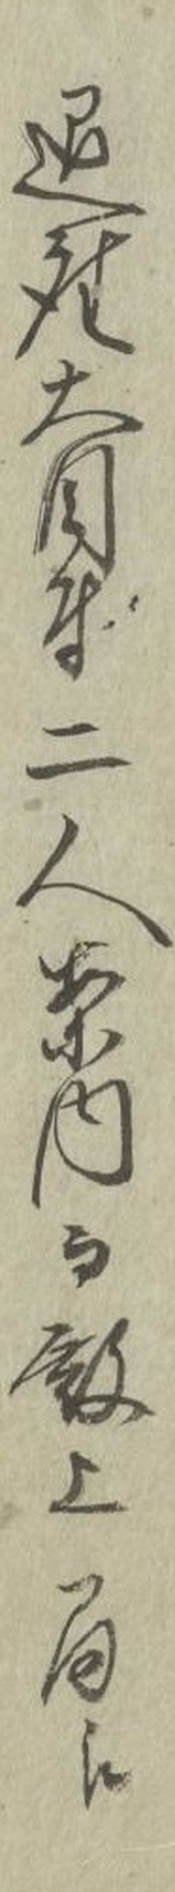退座大目付二人案内而殿上間え
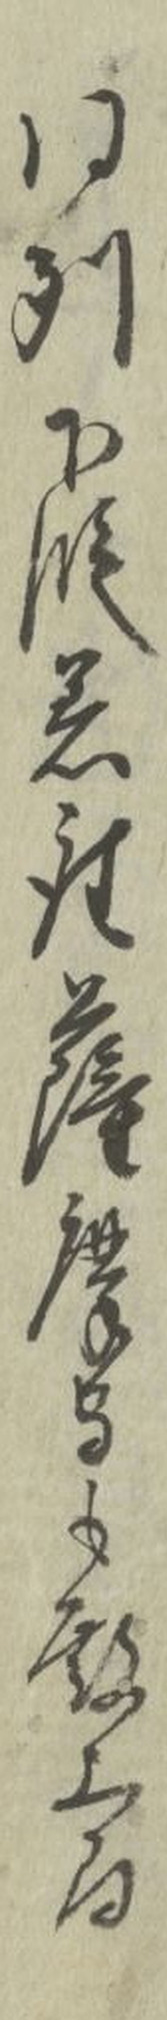同列下段着座薩摩守も殿上間
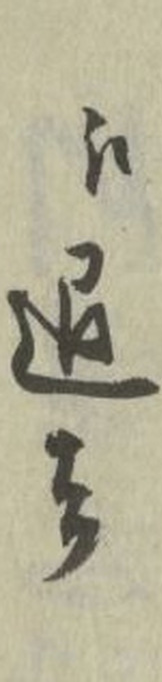え退去
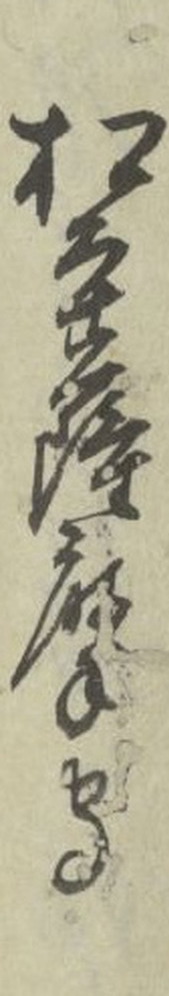松平薩摩守
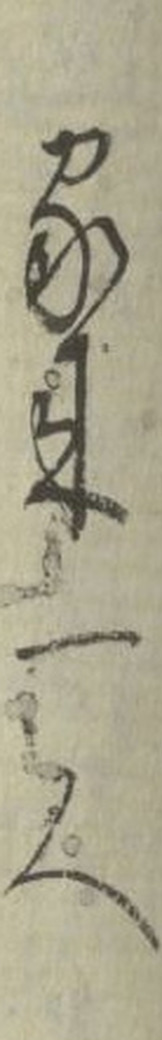家来一人
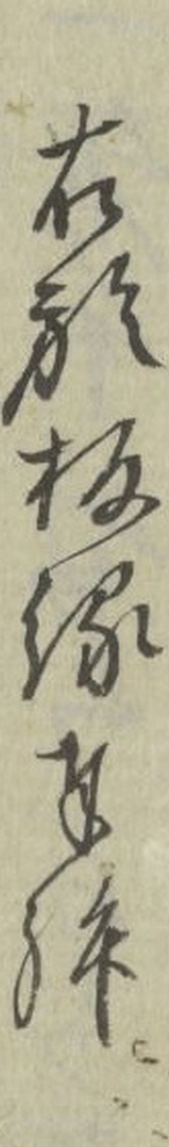右於板縁奉拝
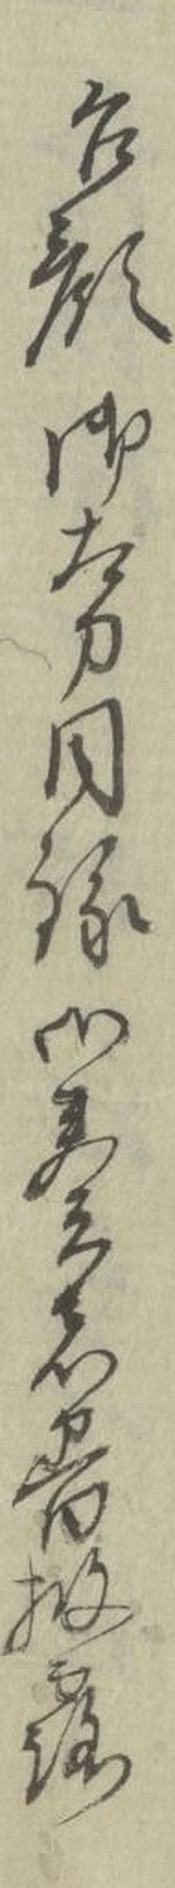台顔御太刀目録御奏者番披露
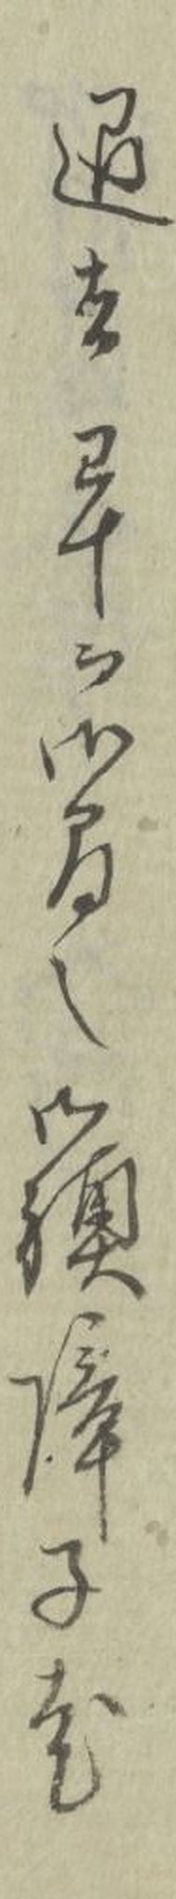退去畢而御間之御襖障子老
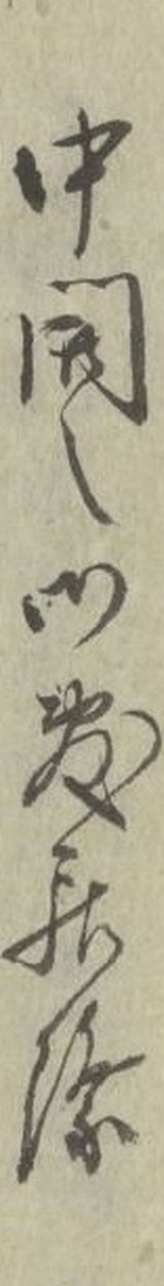中開之御敷居際

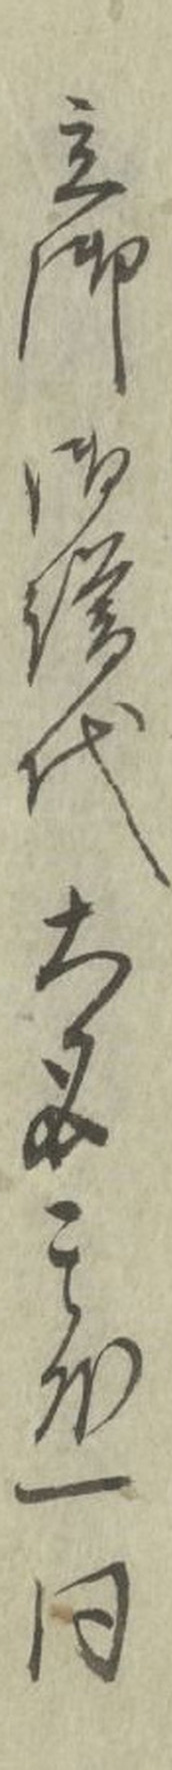立御御譜代大名其外一同
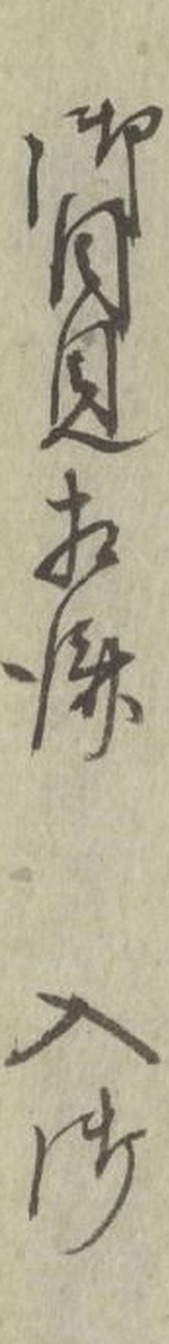御目見相済入御
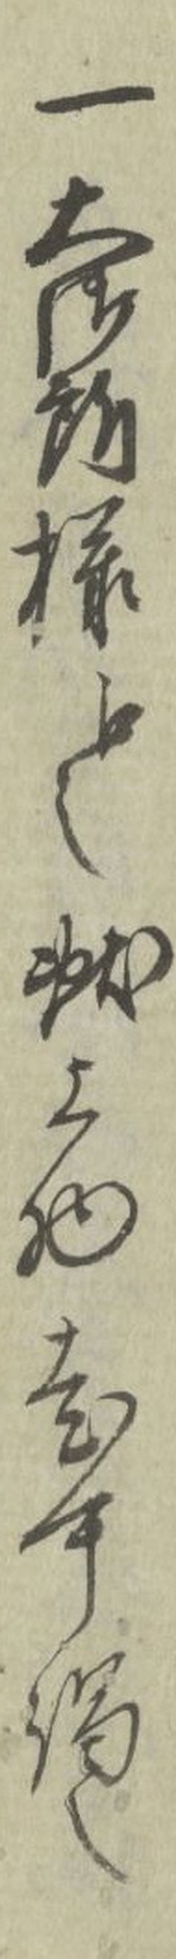一大御所様え之献上物老中謁之
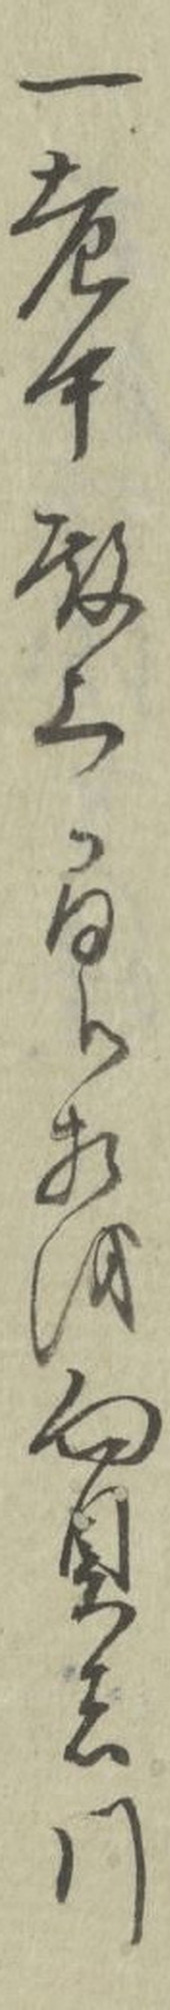一老中殿上之間え相越向具志川
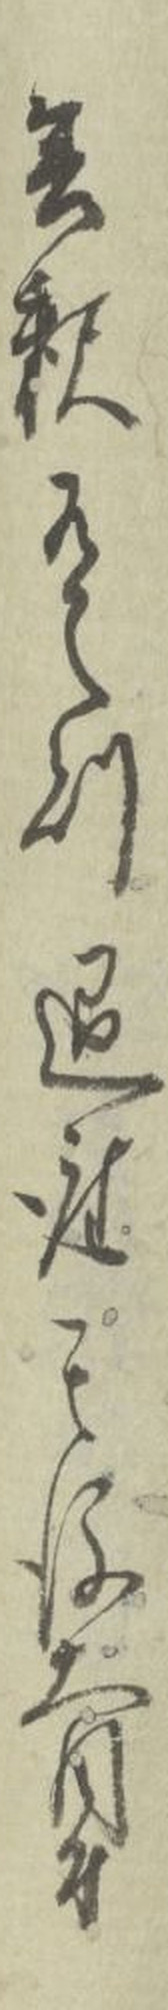会釈有之則退座其後大目付
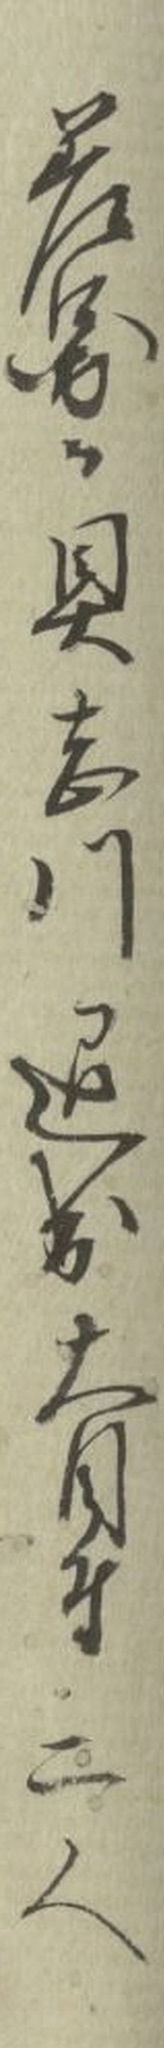差図而具志川退出大目付二人
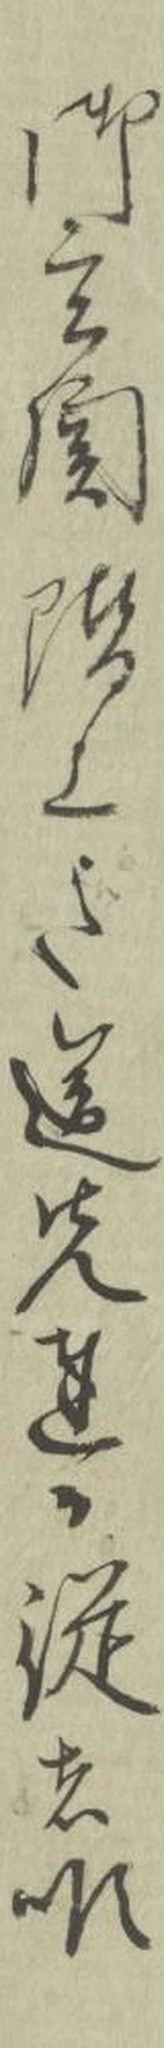御玄関階上迄送先達而従者順
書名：琉球来朝記 自八至十四終
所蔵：University of the Ryukyus Library
